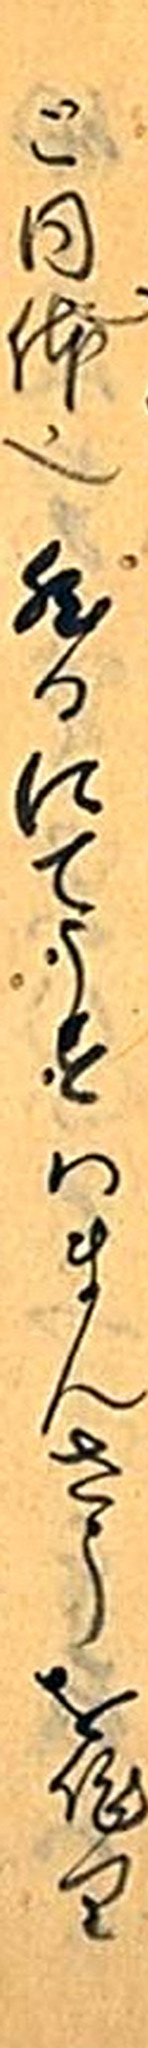と同体也然るにてうすはまんさうを作り
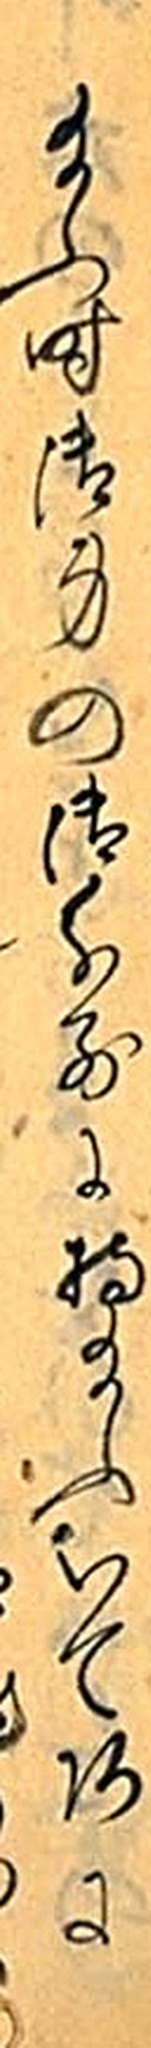給ふ時御身の御分別に持給ふいてあに
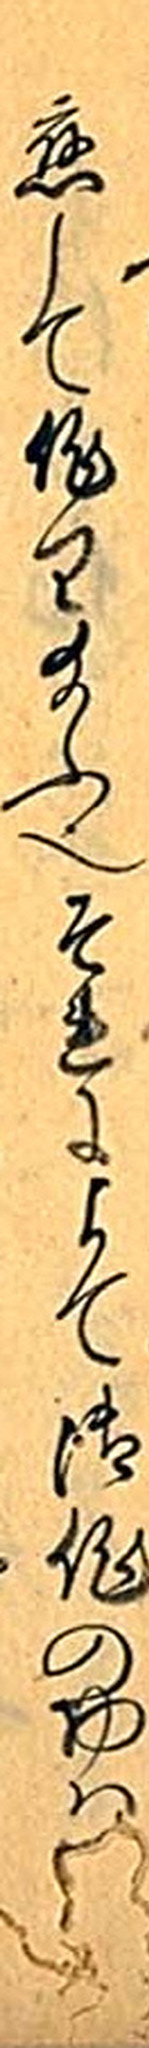応して作り給ふ也それによて御作の物は
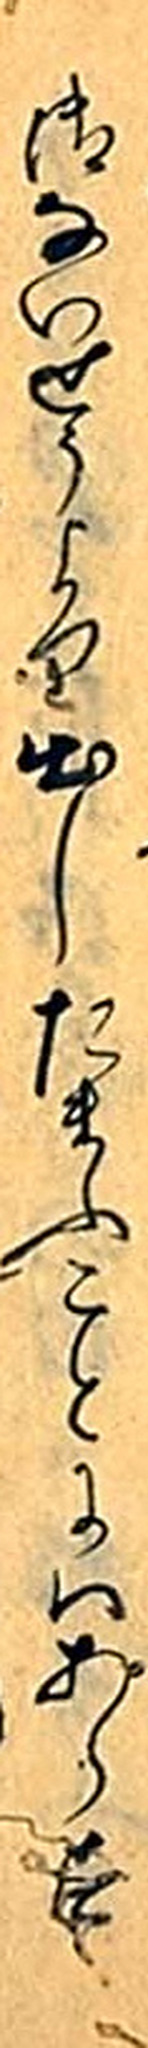御ないせうより出したまふことにはあらす
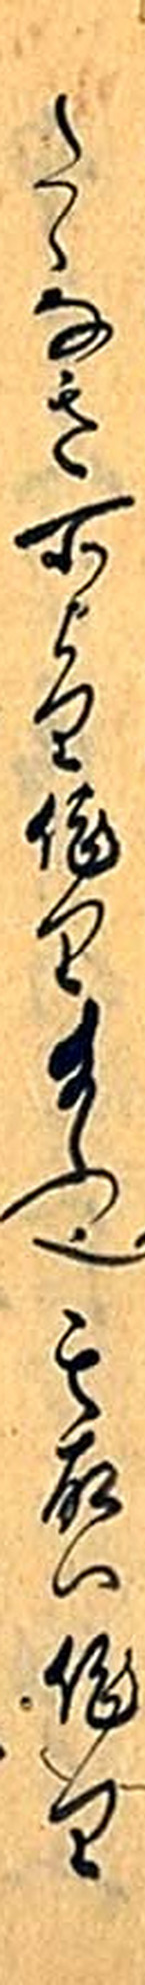たゝなき所より作り給ふ也其故は作り
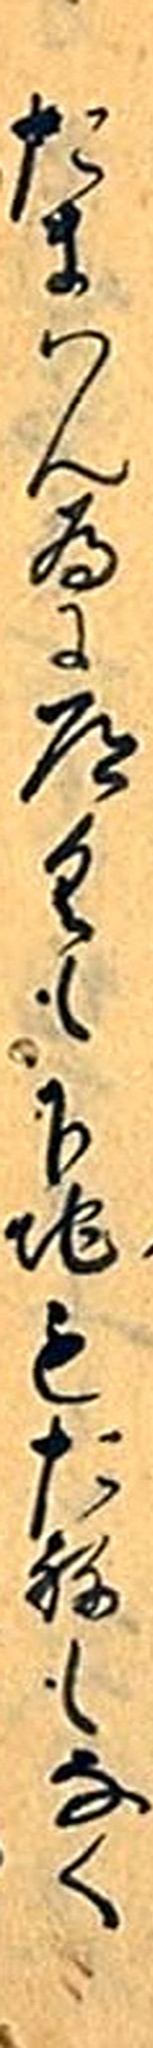たまはん為に道具も下地もたねもなく
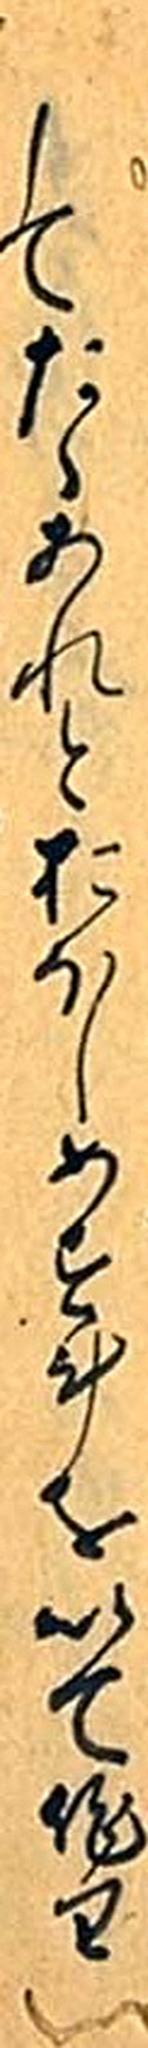してたゝあれとおほしめす計を以て作り
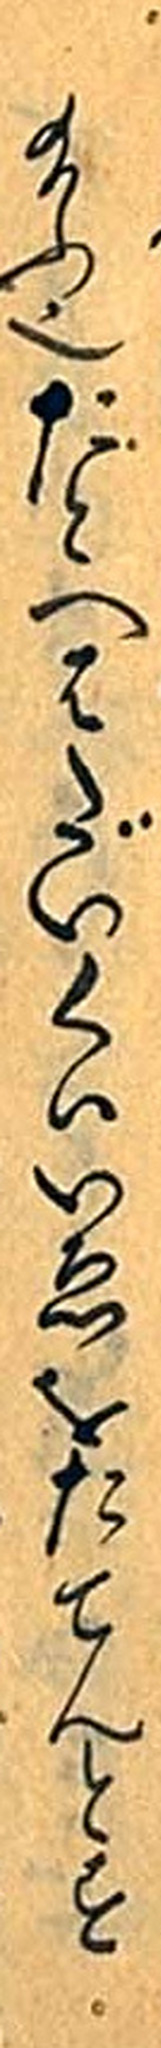給ふ也たとへはだいくはいゑをたてんとす
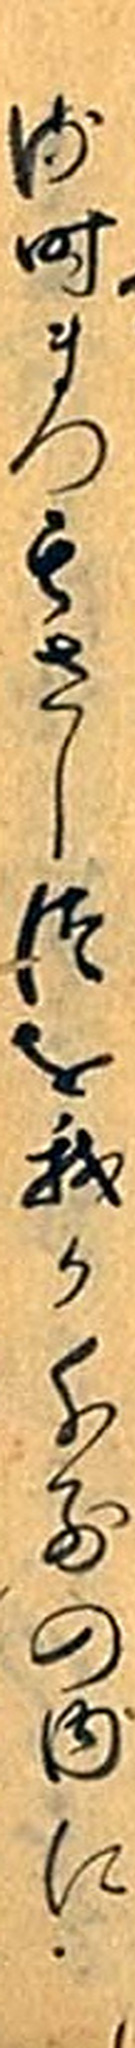る時まつ其さしつを我か分別の内に
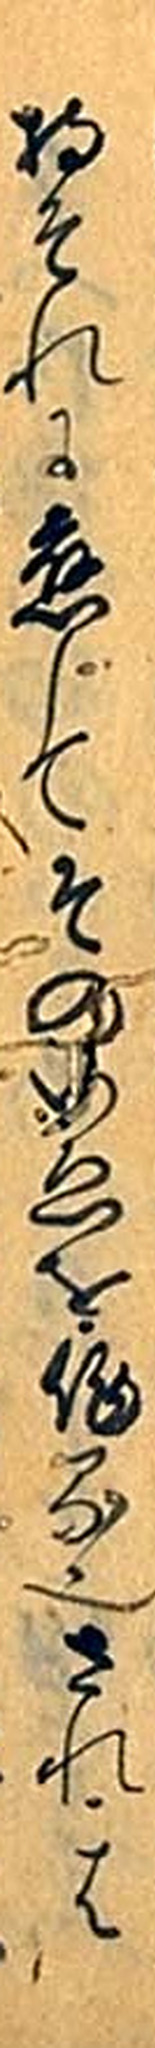持それに応してそのいゑを作る也されは
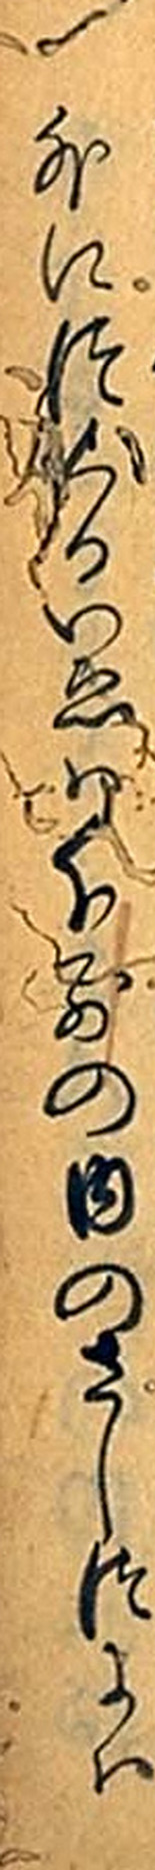外につくるいゑは分別の内のさしつには

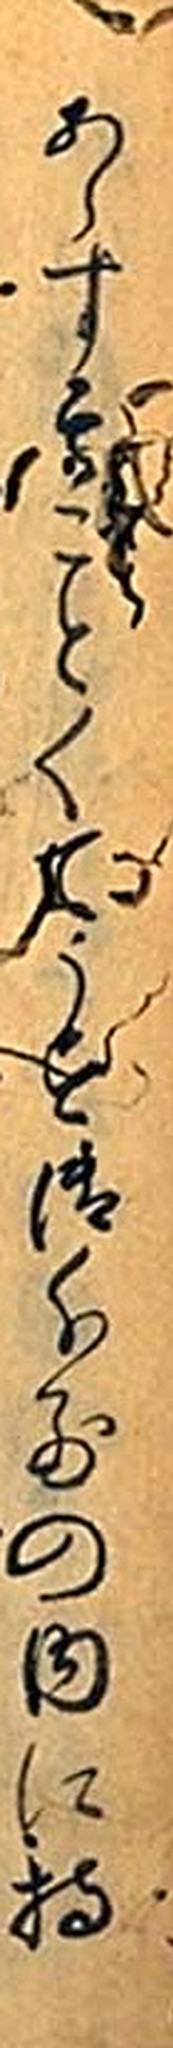あらす其ことくてうす御分別の内に持
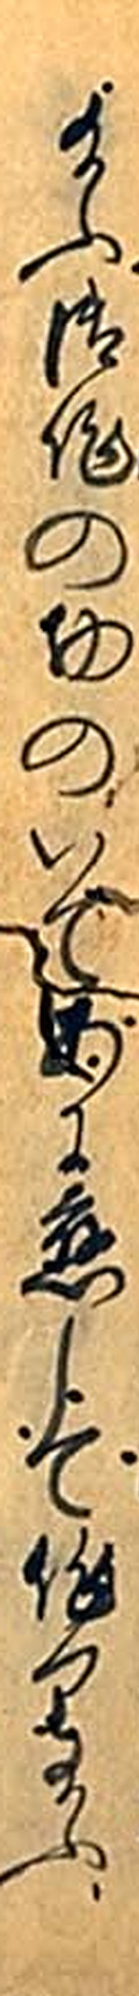給ふ御作の物のいてあに応して作り給ふ
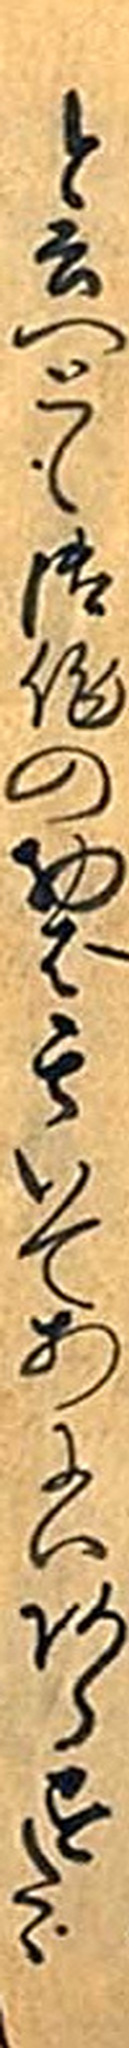と云へとも御作の物は其いてあにはあらすたゝ
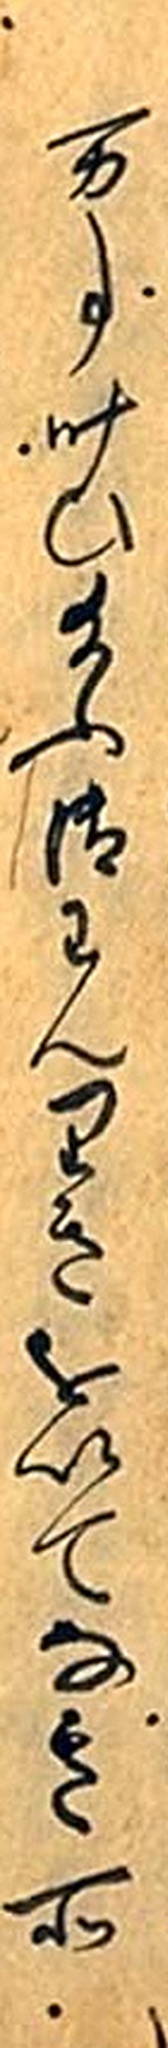万事叶ひ給ふ御わんりきを以てなき所
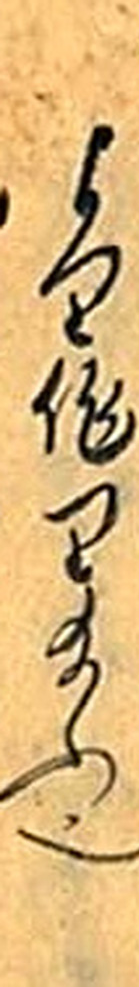より作り給ふ也
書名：ドチリナ・キリシタン
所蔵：東京大学総合図書館 / General Library in the University of Tokyo
